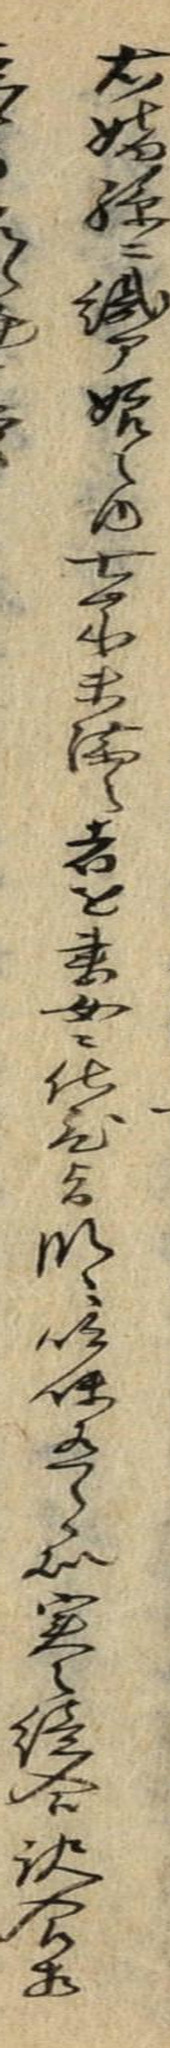右嫡孫ニ織部娘之内七歳未満之者を妻女ニ仕度旨段々ニ吟味有之候処実之続合訳合相
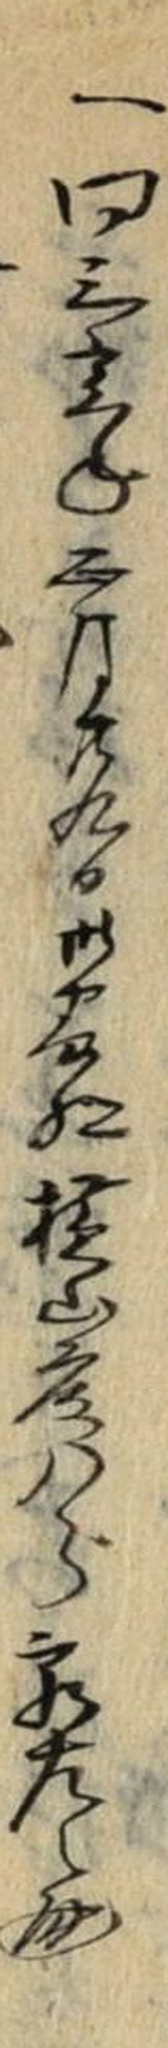一同三亥年正月廿九日御番組横山藤八郎願左之通
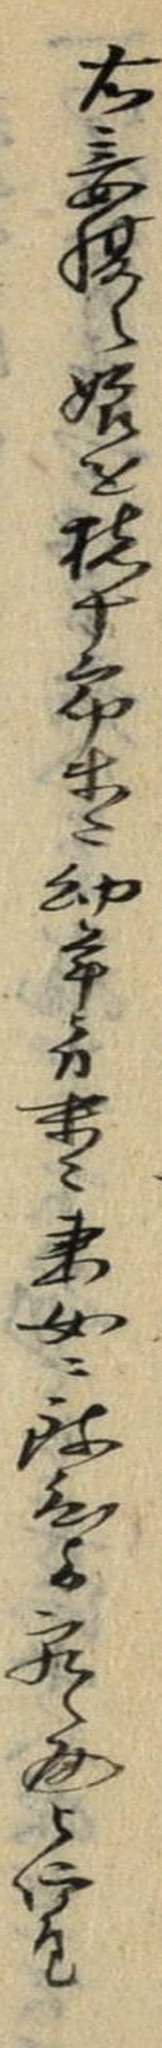右妾腹之娘を猪十郎未た幼年ニ付末々妻女ニ致度旨願之通被仰付候
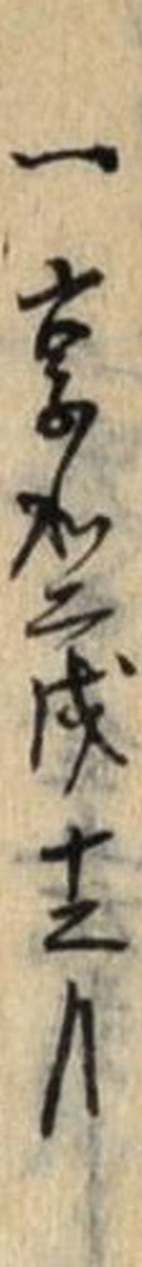一享和二戌十二月
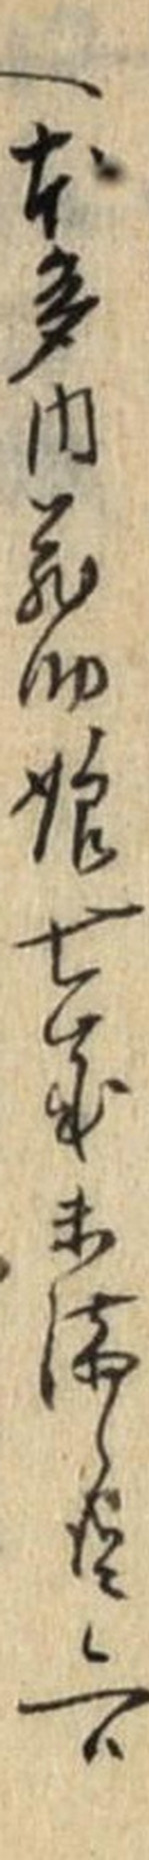本多内蔵助娘七歳未満之儀ニ候へハ
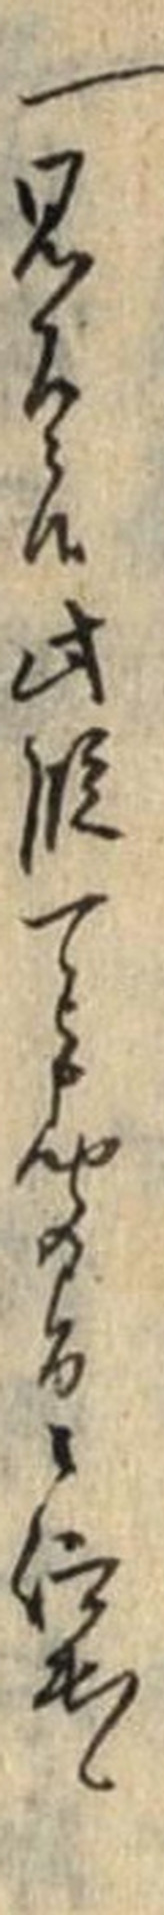思召ニ候此段可被申聞旨被仰出候
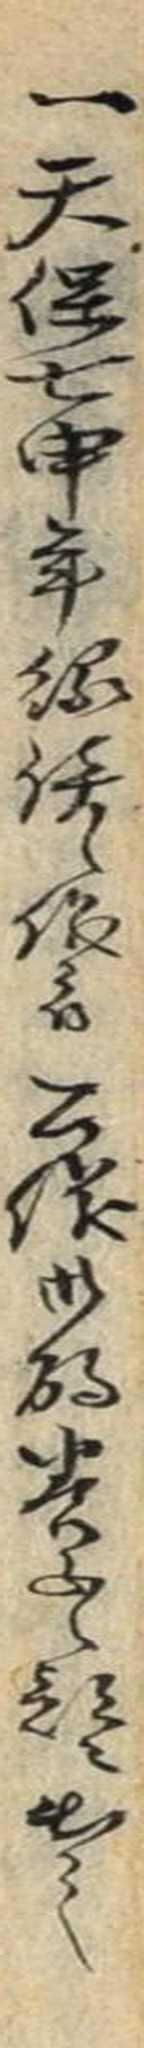一天保七申年縁談之儀ニ付公儀御触養子之部ニ出之
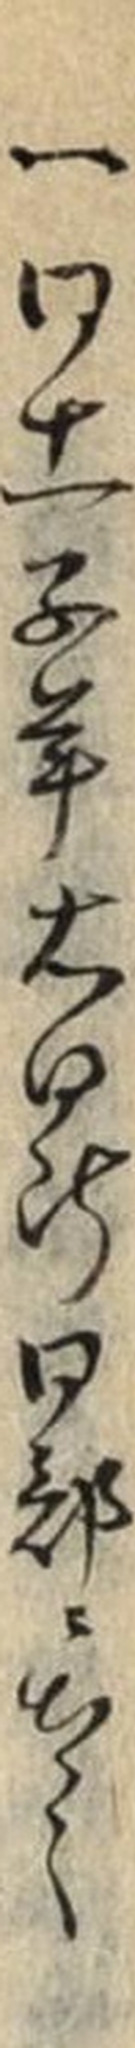一同十一子年右同断同部ニ出之
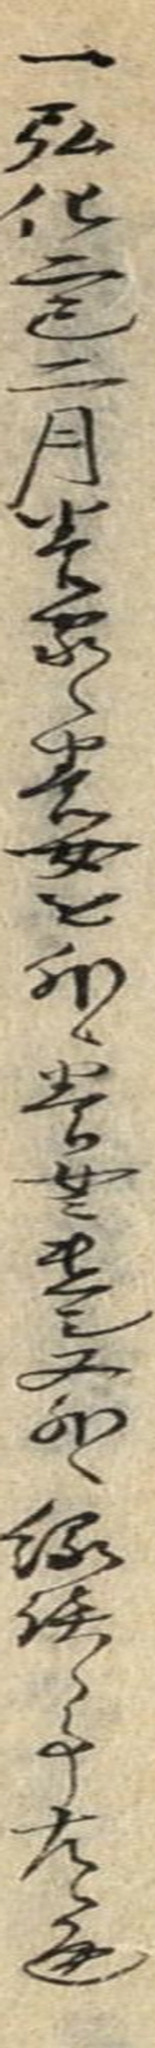一弘化二巳二月養家養女を外ニ養女ニ遣し又外へ縁談之事左之通
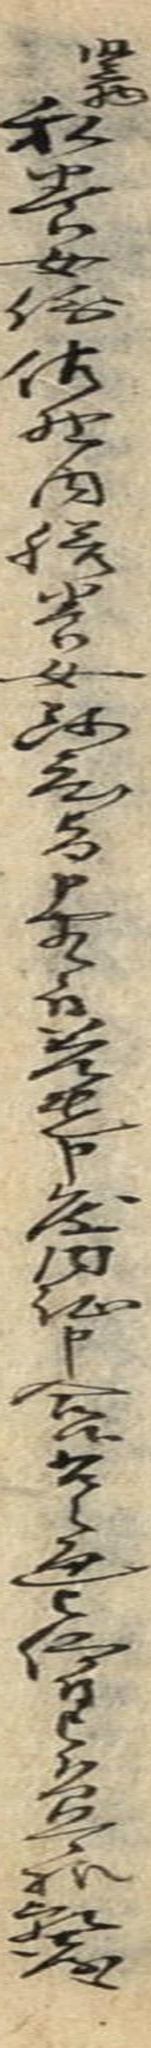私養女儀佐野内膳養女致度旨申聞候ニ付差遣申度内証申合候右之通被仰付被下置候様願奉存候
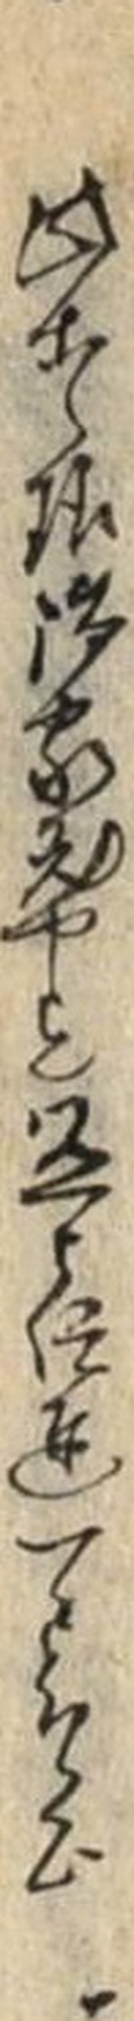此等之趣御家老中迄宜被仰達可被下候以上
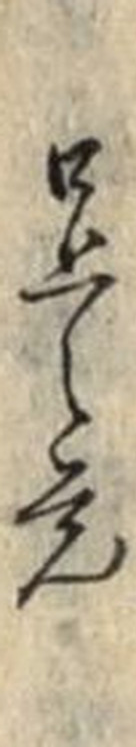口上之覚
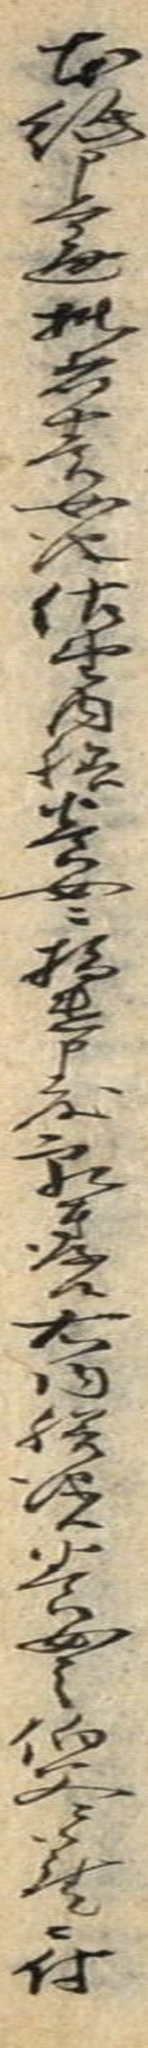本紙申上候通拙者養女儀佐野内膳養女ニ指遣申度願奉存候右内膳儀ハ養女之伯父ニ御座候ニ付
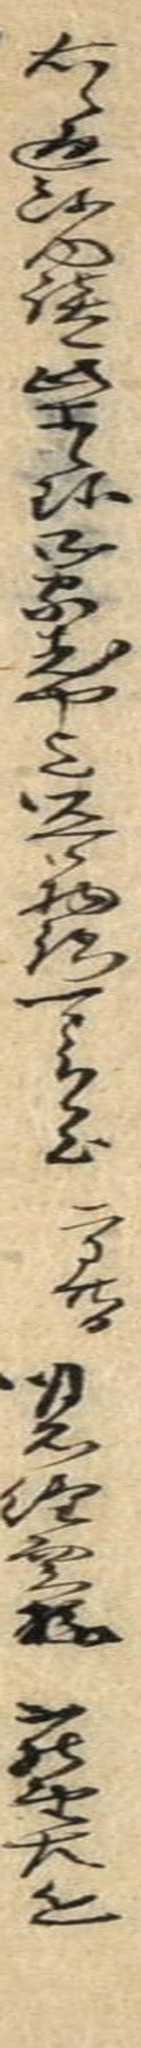右之通致内談候此等之趣御家老中迄宜御物語可被下候以上二月廿日明石縫殿様荻野左近
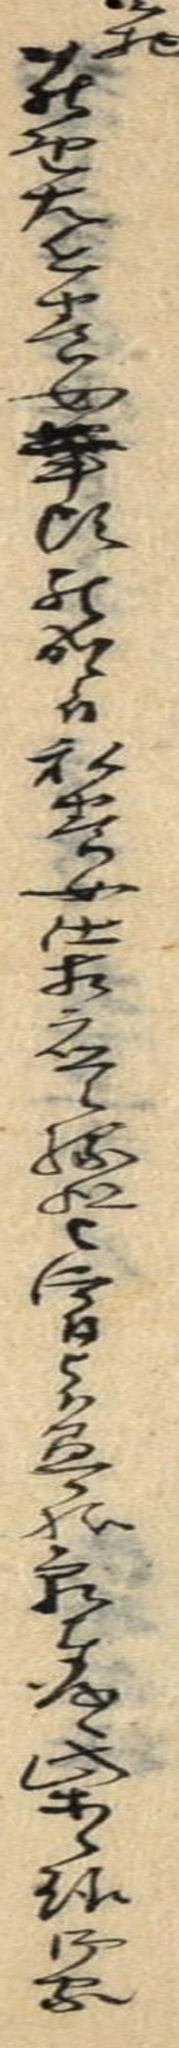荻野左近養女年頃罷成候ニ付私養女仕相応之縁組被仰付被下置候様願奉存候此等之趣御家

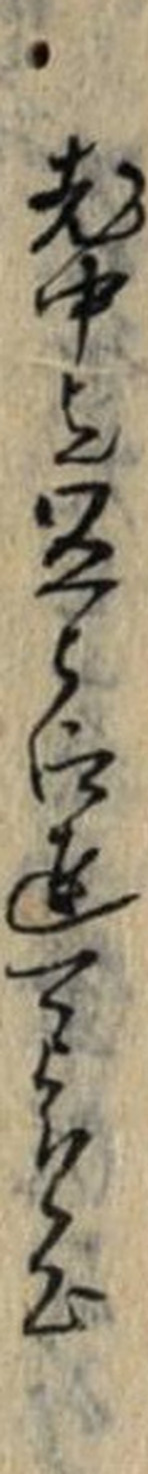老中迄宜被仰達可被下候以上
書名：養子縁組之部
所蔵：福井県文書館 Fukui Prefectural Archives
